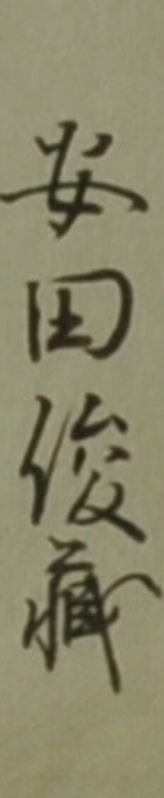安田俊蔵

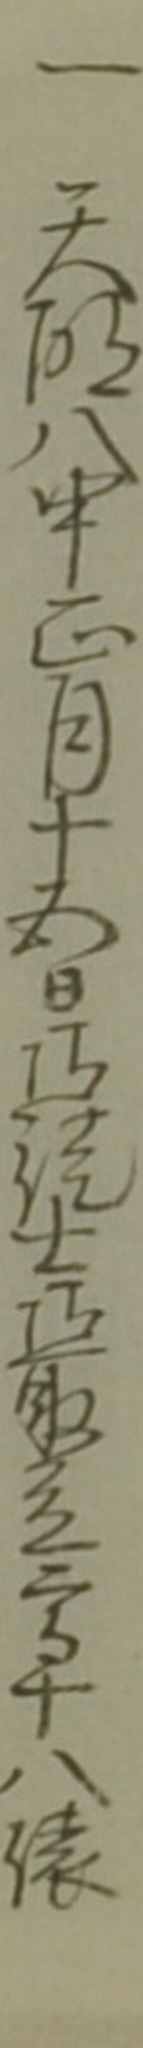一天明八申正月十五日御徒士御取立高十八俵
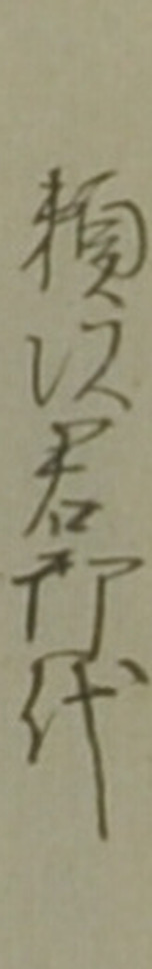頼以君御代
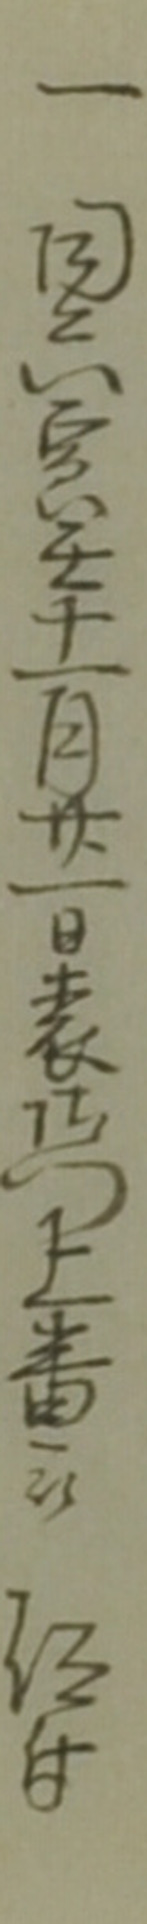一同六寅閏十一月廿一日表御門上番被仰付
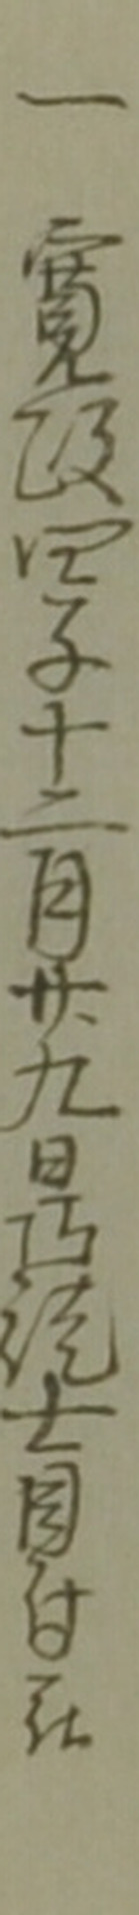一寛政四子十二月廿九日御徒士目付被
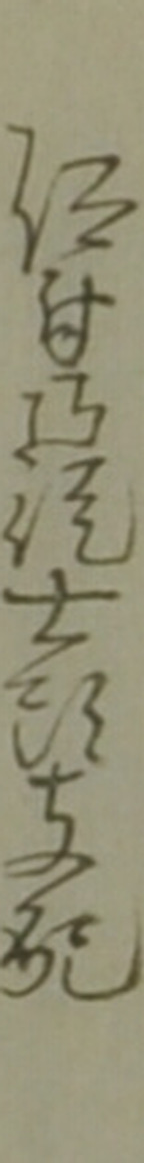仰付御徒士頭支配
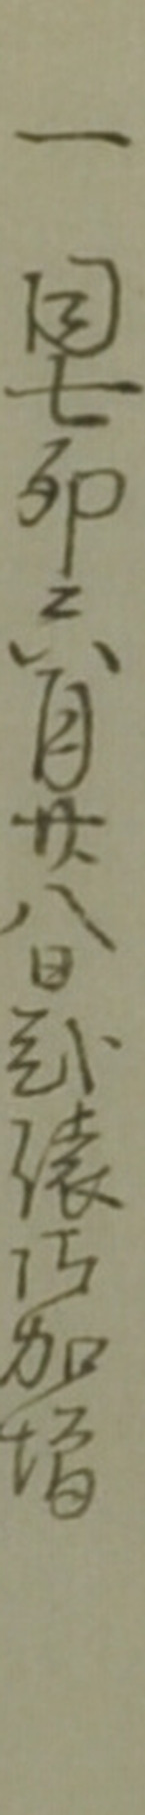一同七卯六月廿八日弐俵御加増
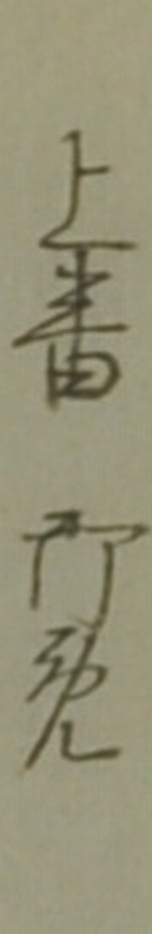上番御免
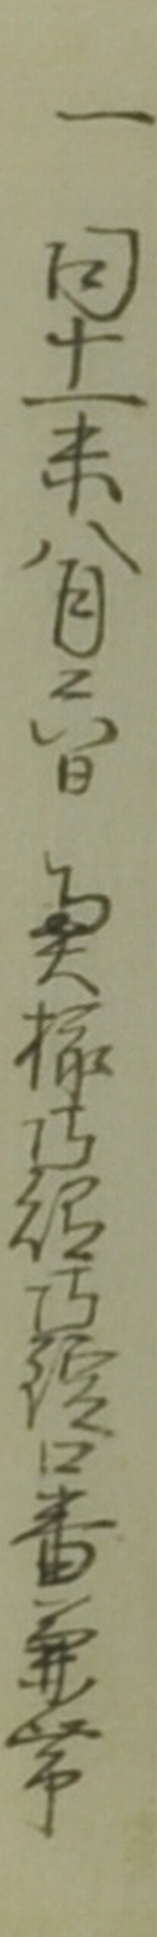一同十一未八月六日奥様御賄御錠口番兼帯
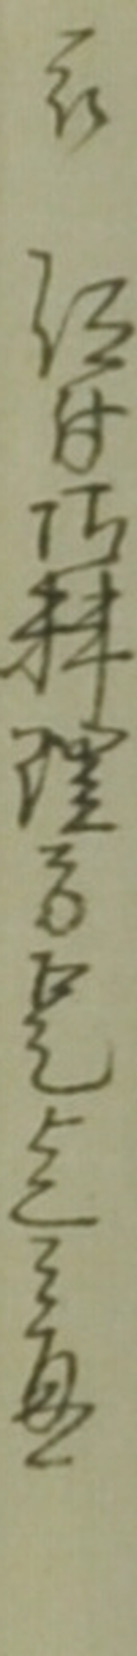被仰付御料理方是迄之通

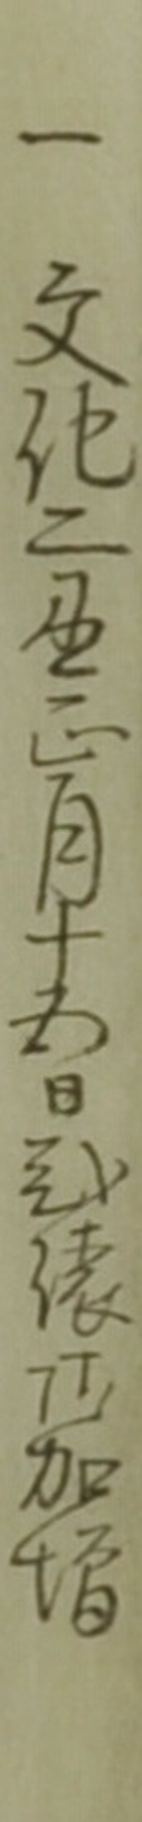一文化二丑正月十五日弐俵御加増
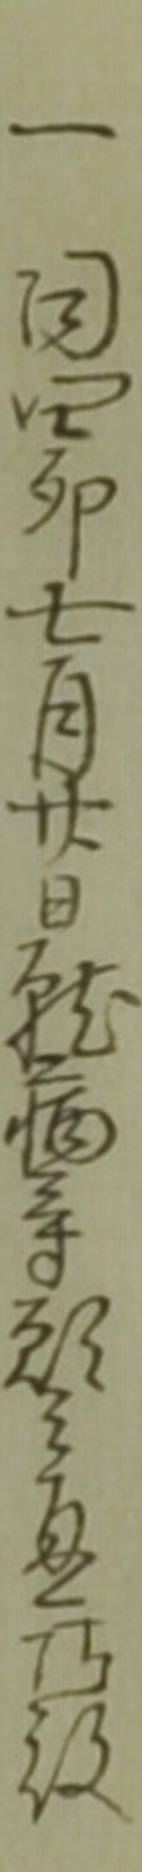一同四卯七月廿日就病気願之通御役
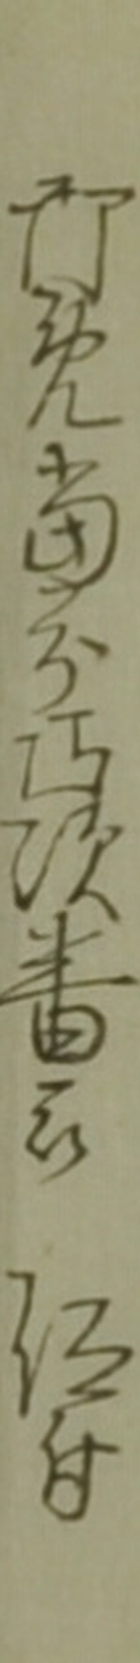御免当分御次番被仰付
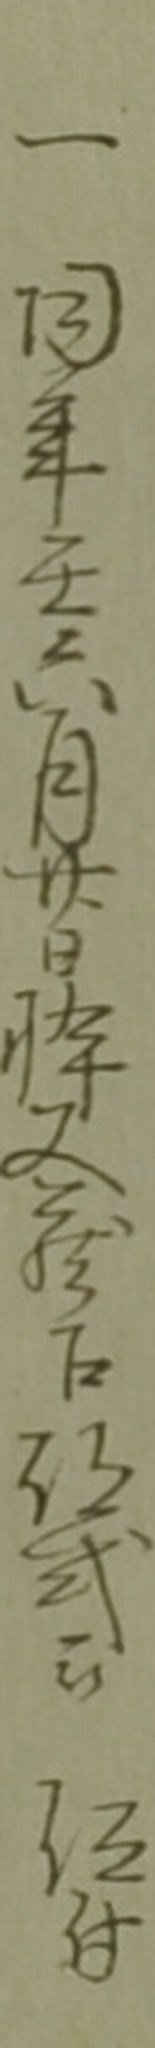一同年閏六月廿日忰又蔵江跡式被仰付
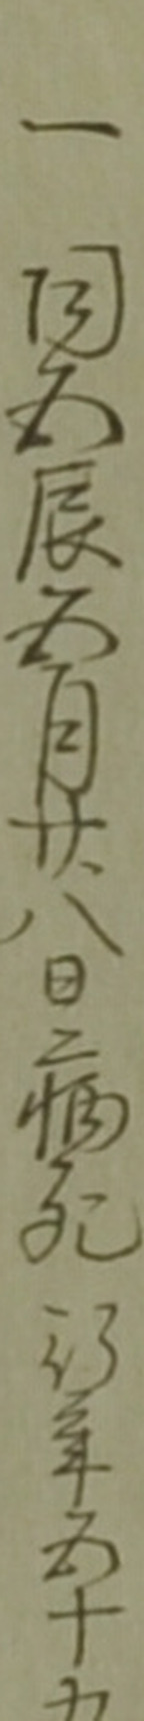一同五辰五月廿八日病死行年五十九歳
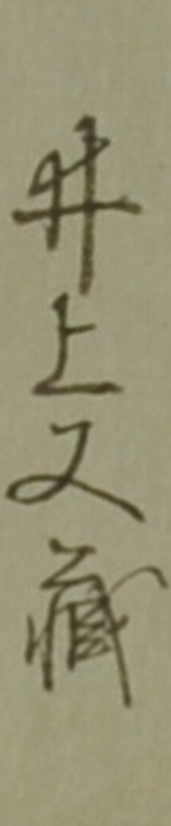井上又蔵
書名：無足諸士勤仕録（一）
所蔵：伊那市立高遠町図書館・合同会社AMANE
